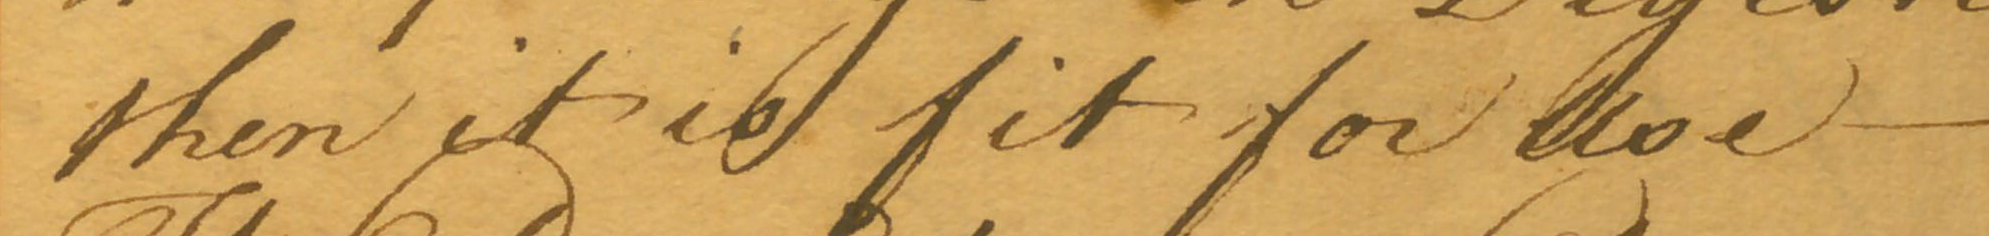them it is fit for Use-
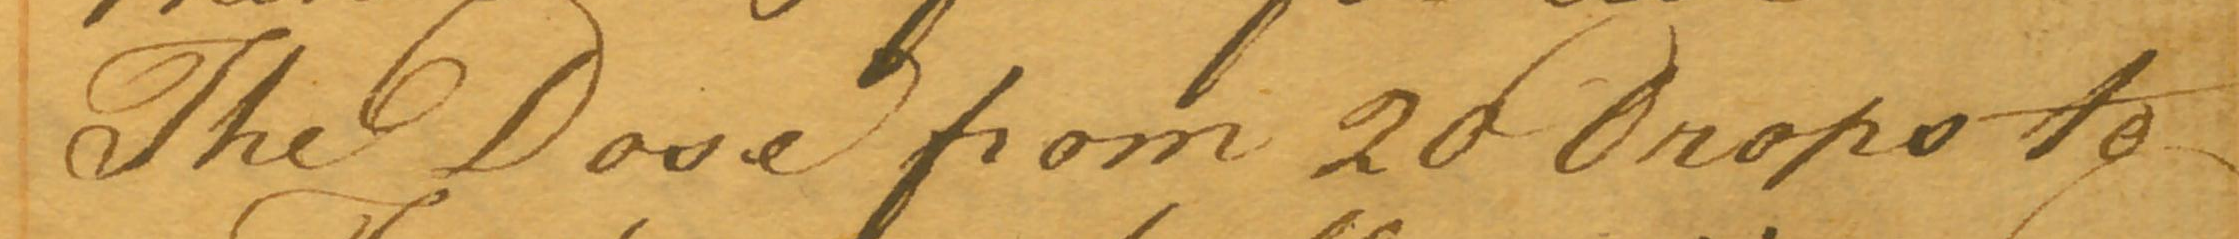The Dose from 20 drops to
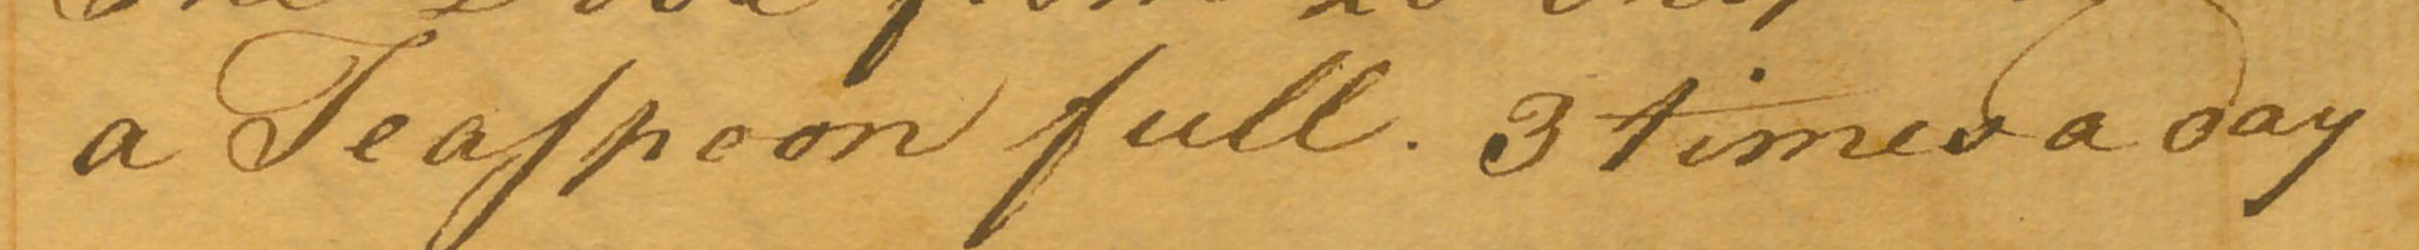a Teaspoon full. 3 times a day
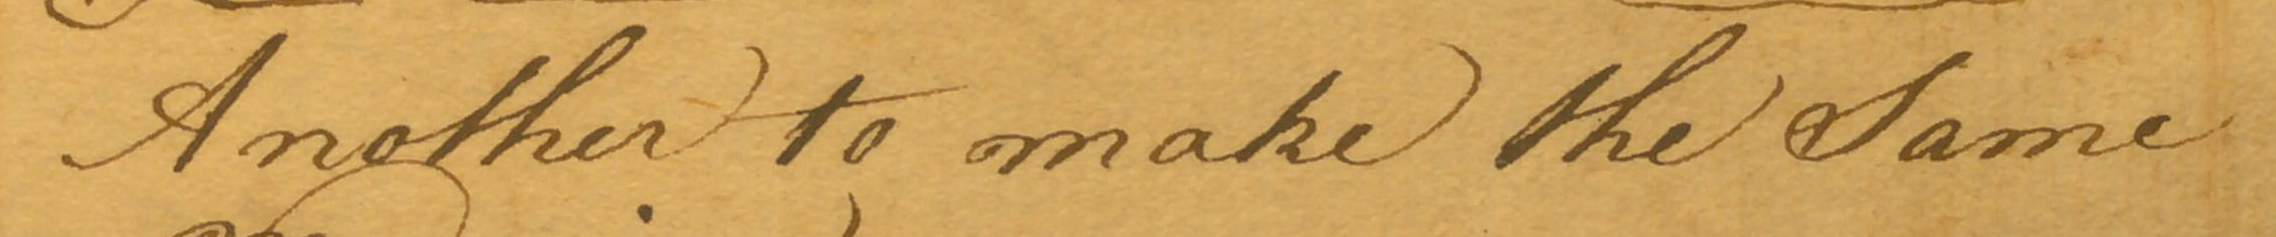Another to make the same
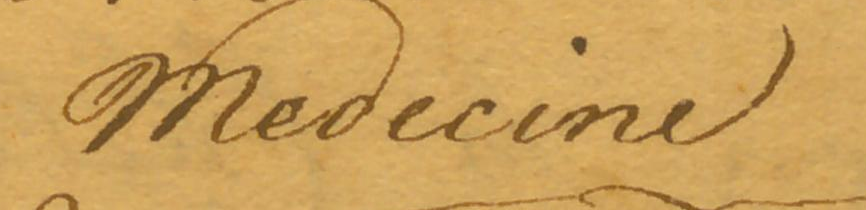Medecine
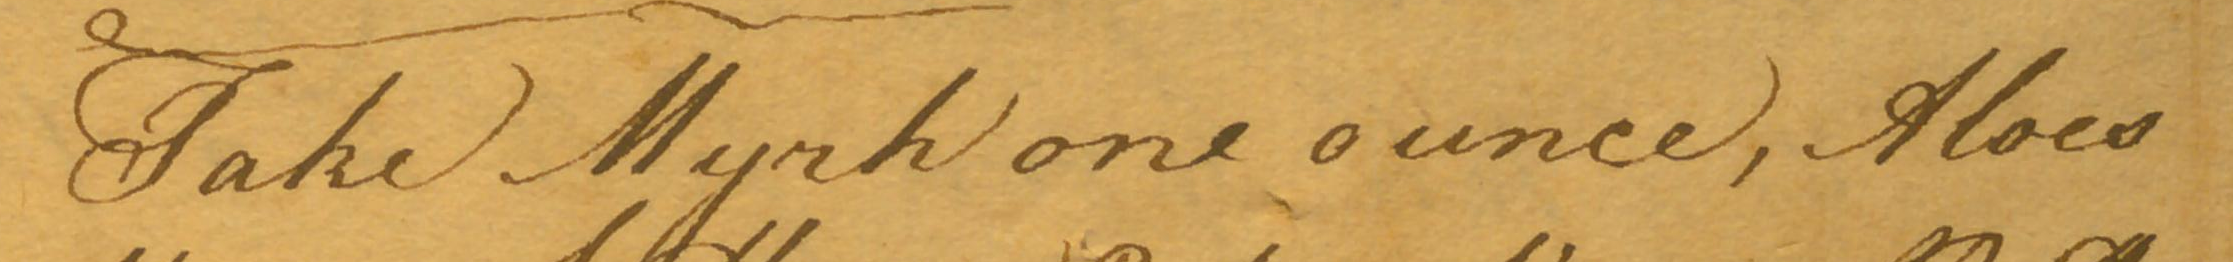Take Myrh one ounce, Aloes
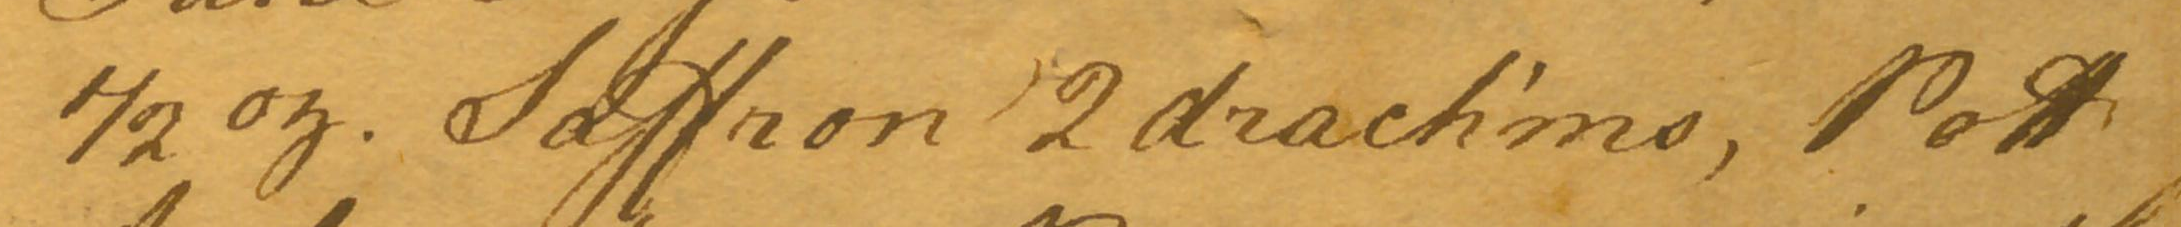1/2 oz. Saffron 2 drach'ms, Pott
